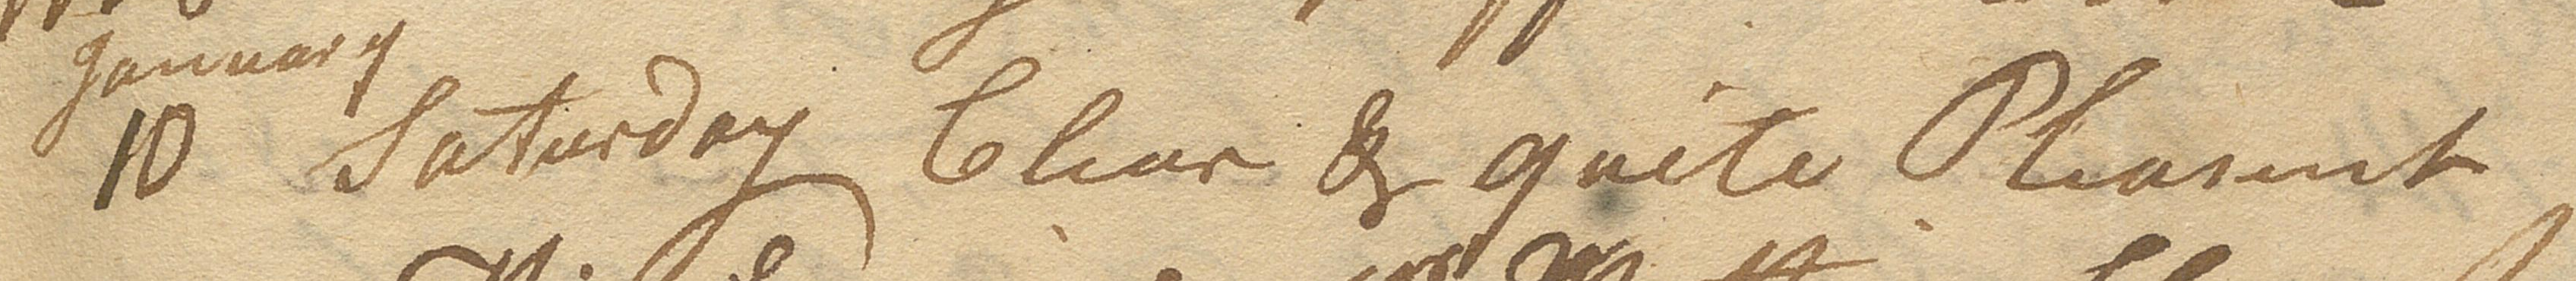10 Saturday Clear & quite Pleasent
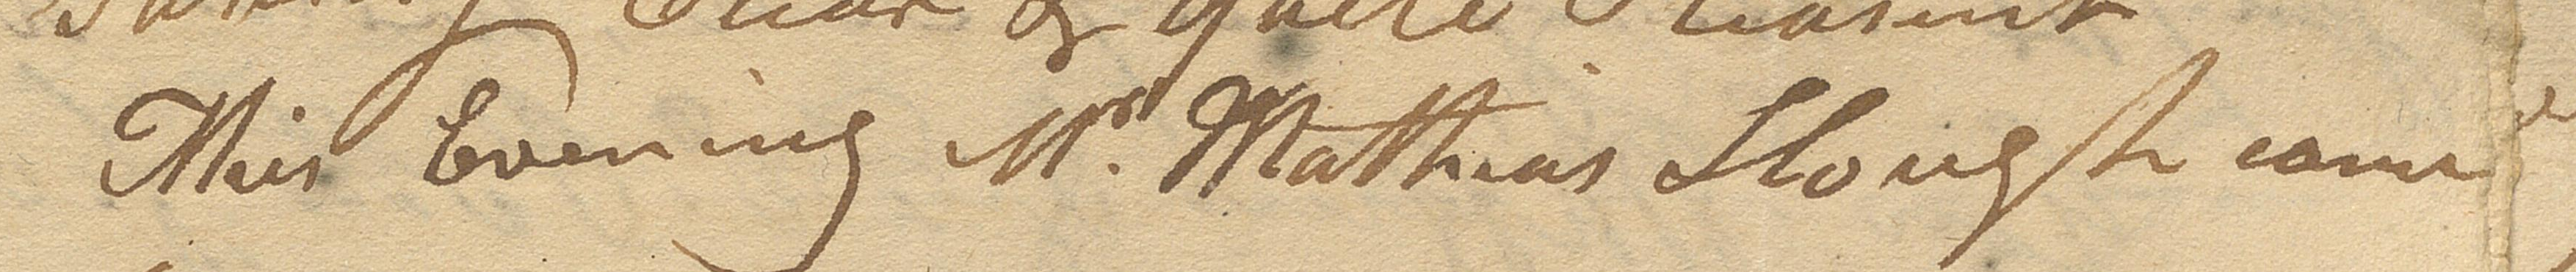this Evening M^r. Mathias Slough came
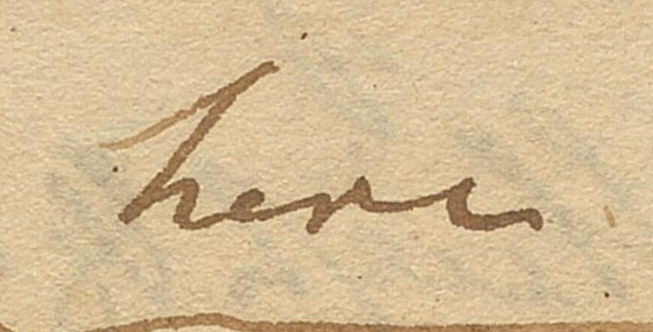here
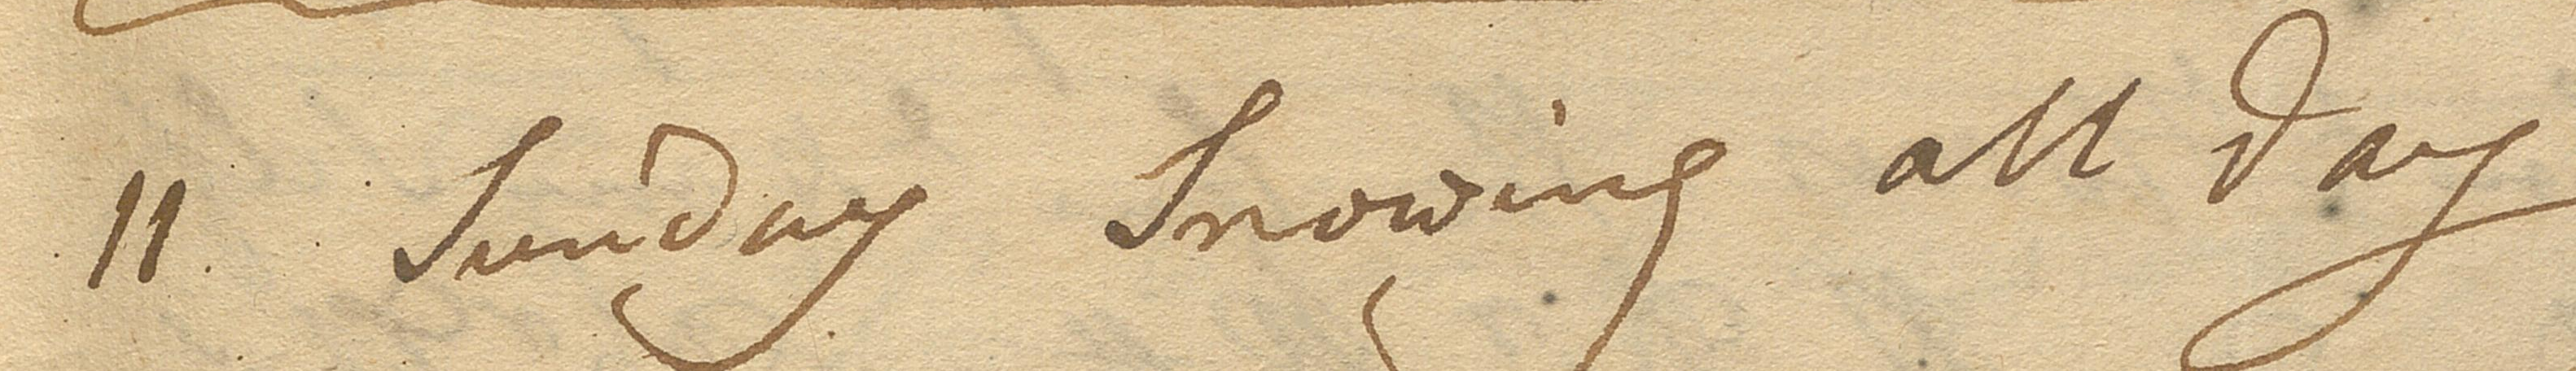11. Sunday Snowing all day
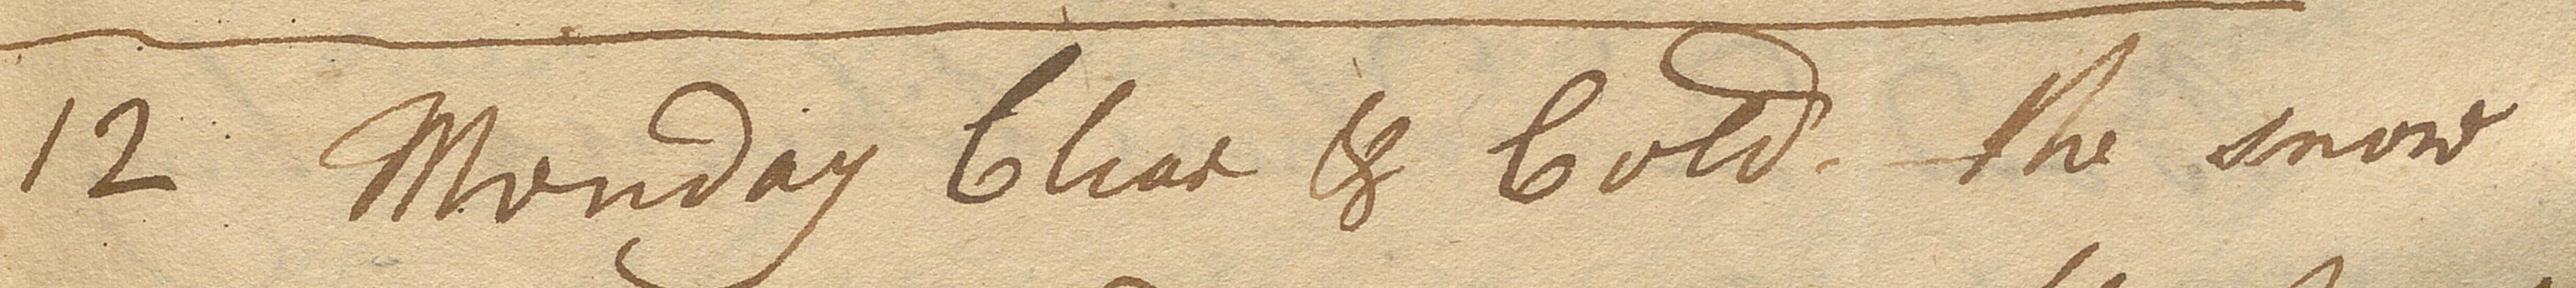12 Monday Clear & Cold. the snow
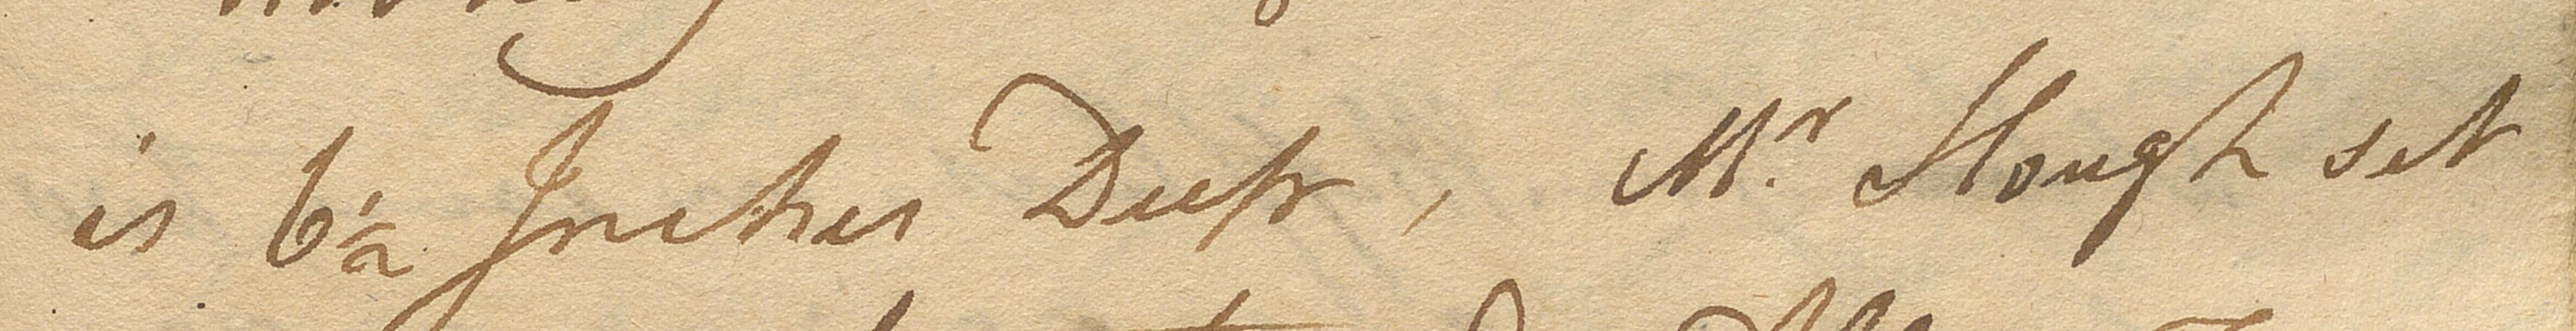is 6 1/2 Inches Deep, M^r. Slough set
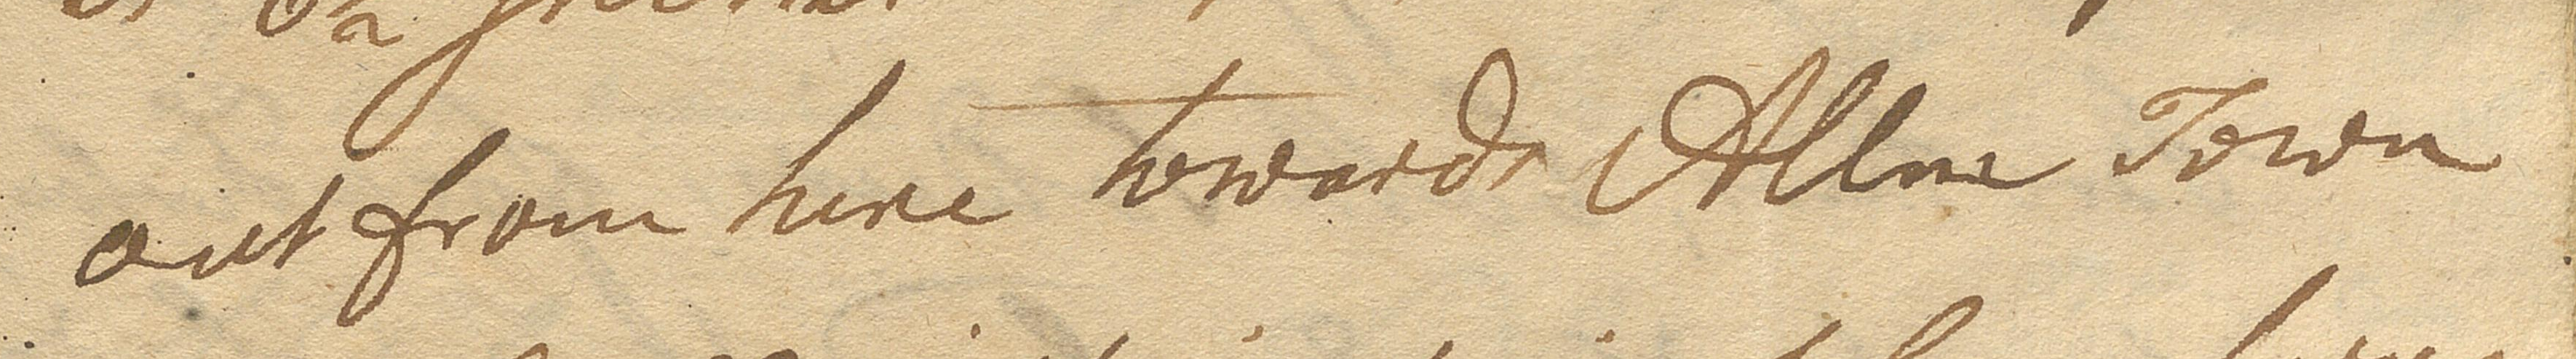out from here towards Allne Town
